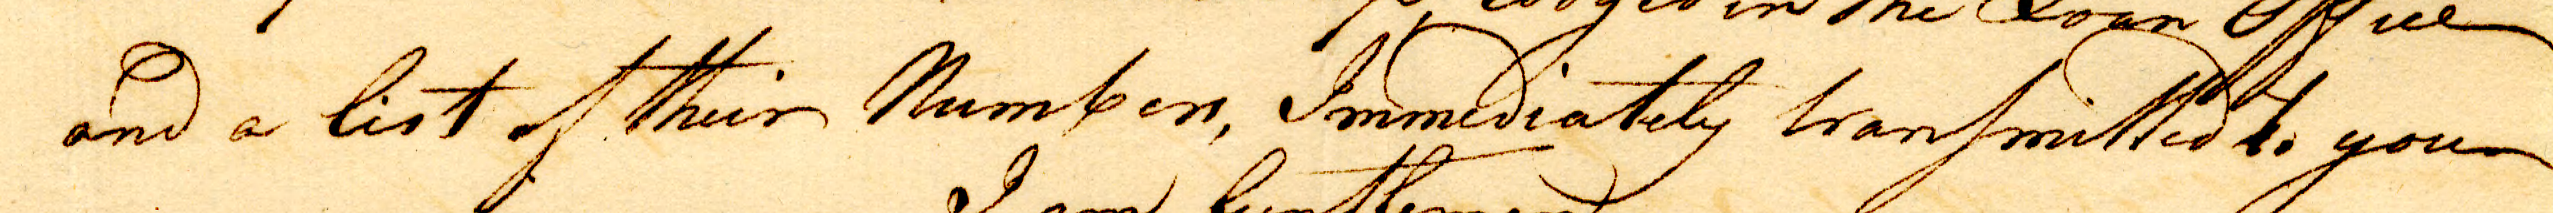and a list of their Number, Immediately transmitted to you.
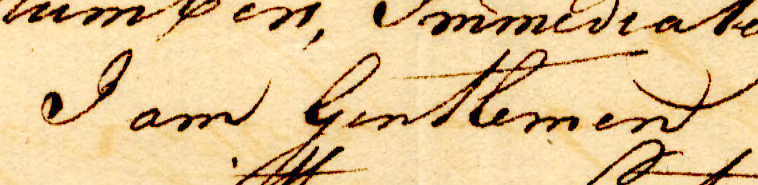I am Gentlemen
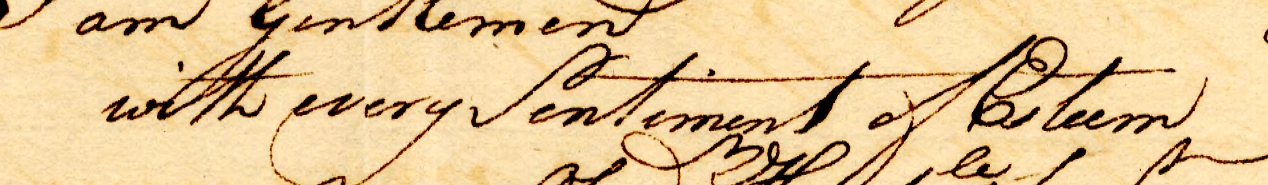with every Sentiment of Esteem
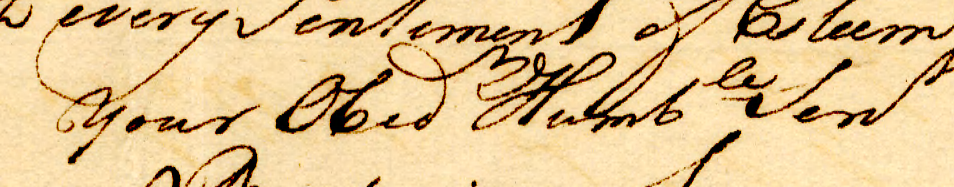Your Obed^t Humb^le Serv^t
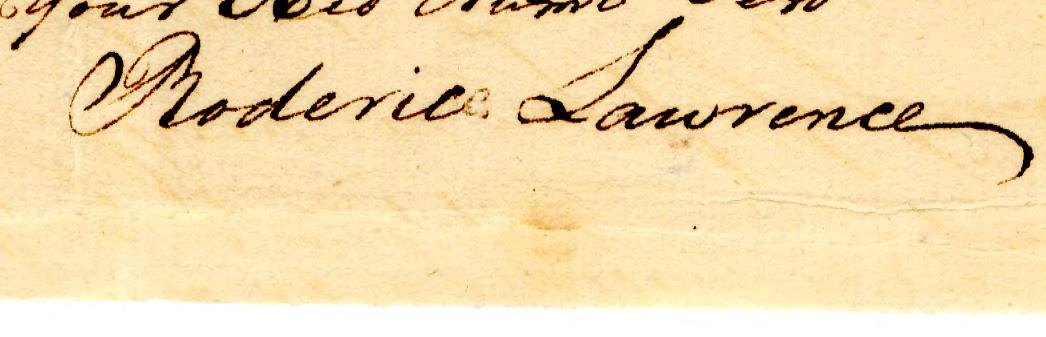Roderic Lawrence
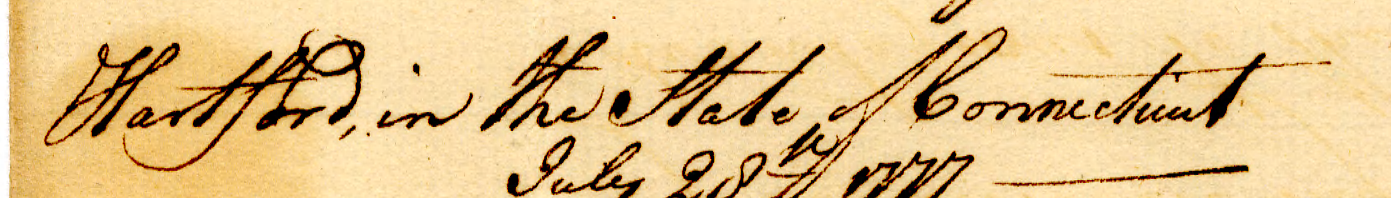Hartford, in the State of Connecticut
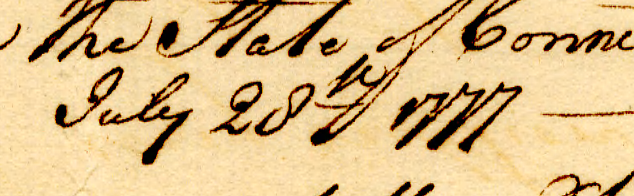July 28^th 1777
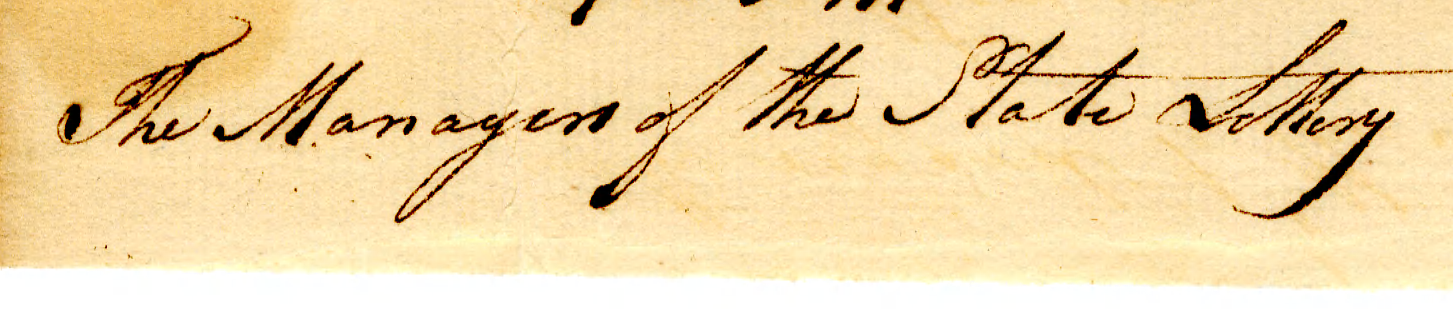The Managers of the State Lottery
